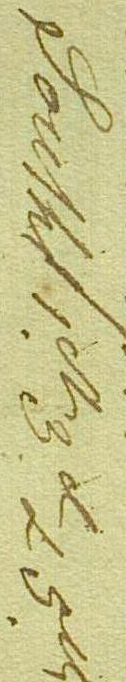Souths 1^st. 3^d. & 5^th.
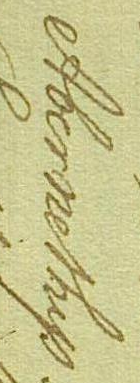Abernethys
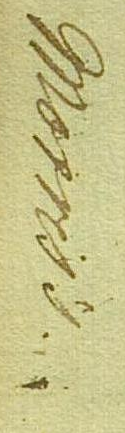Morris's.
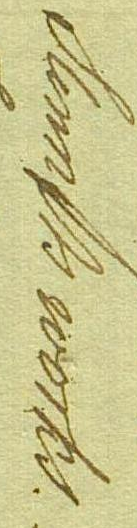Stennetts works.
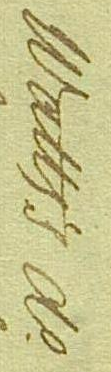Watts's d^o.
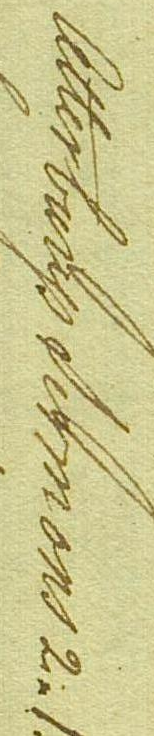Atterburys Sermons 2.1.
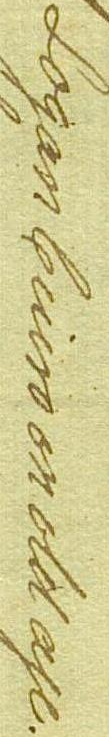Logan Cicero on old age.
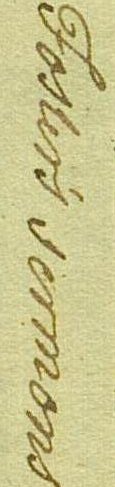Foster's sermons
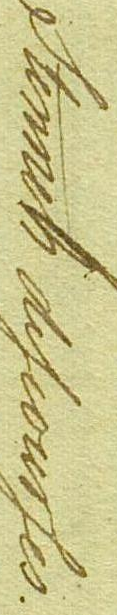Stennetts discourses.
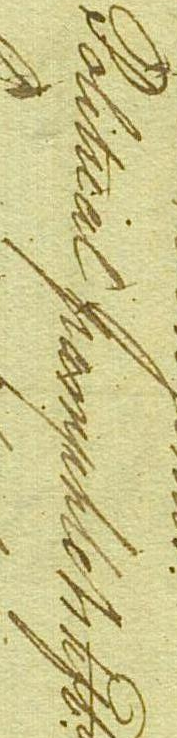Political pamphlets test^d.
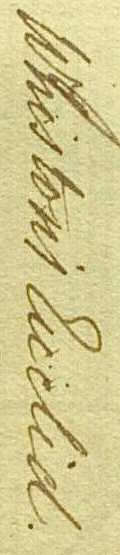Whiston's Euclid.
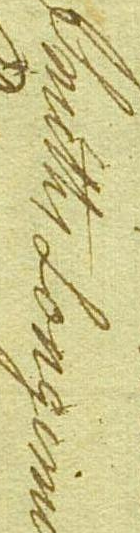Smiths Longinus.
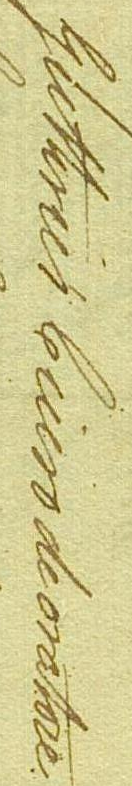Guthrie's Cicero de oratore.
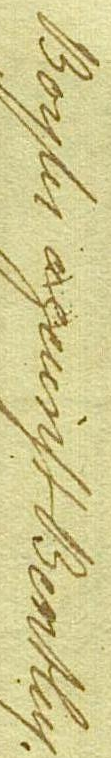Boyles against Bentley.
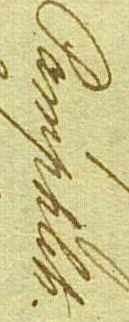Pamphlets.
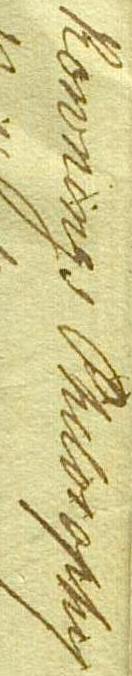Rownings Philosophy.
